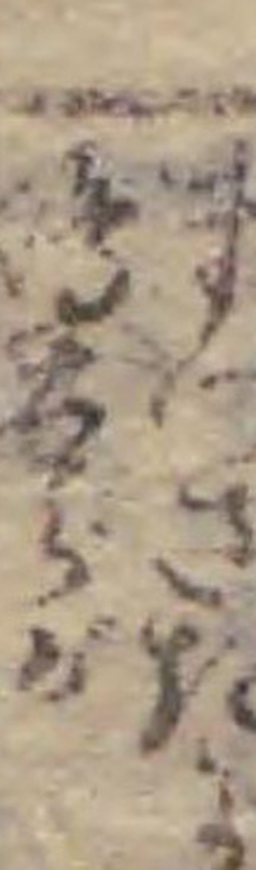島太郎が
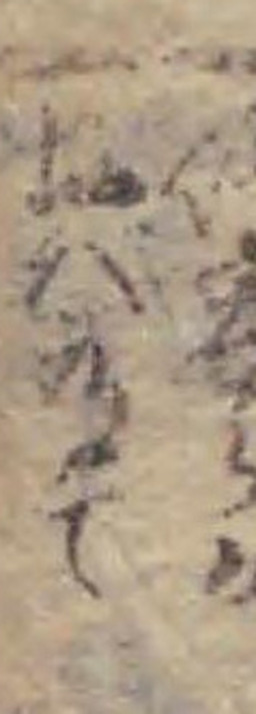おば有て
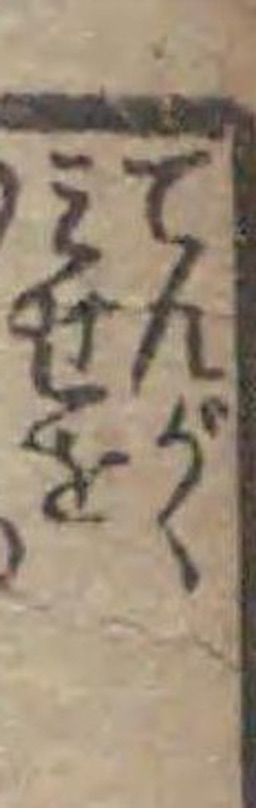みせを
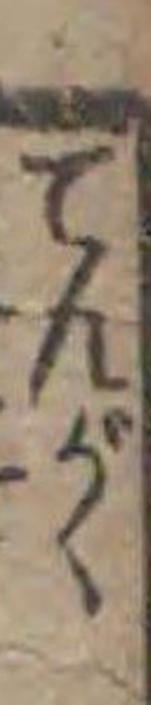てんがく
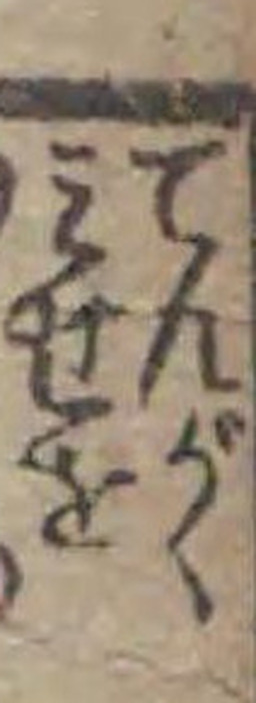みせを
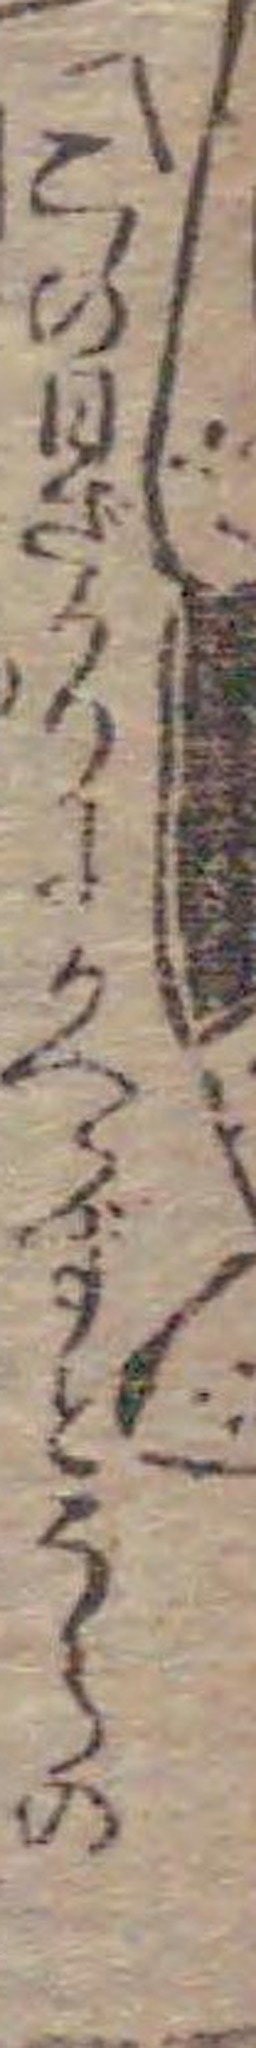〽この日ざかりにかへらずとうしろの
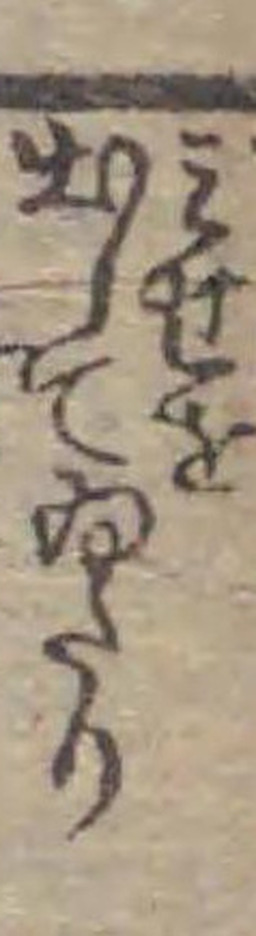出してゐたり
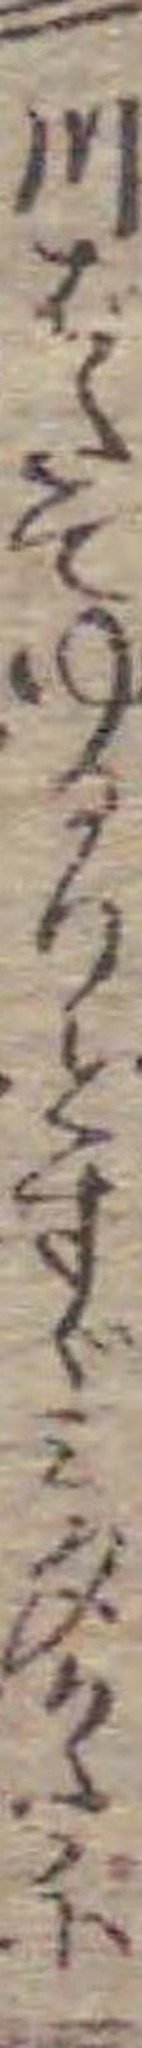川ばたてゆるりとすゞみ夕かたに
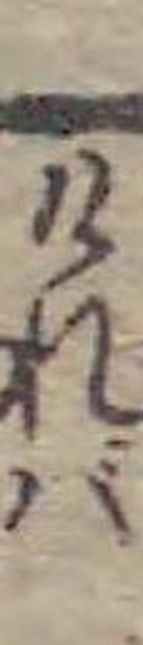ければ
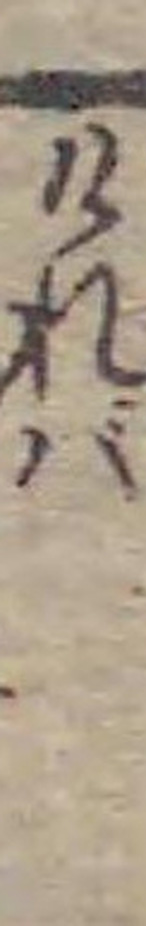ければ
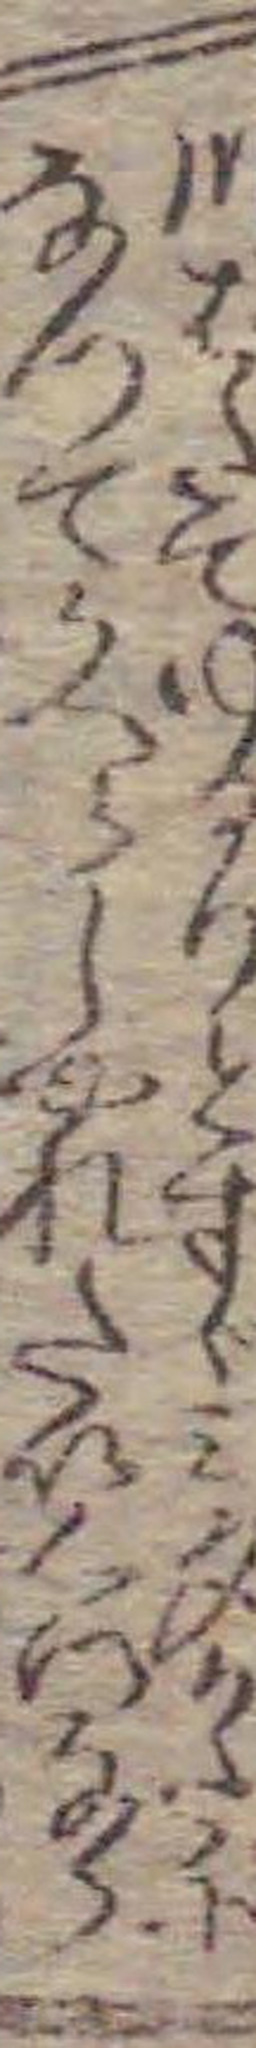なつてかへらしやれたいくつなら
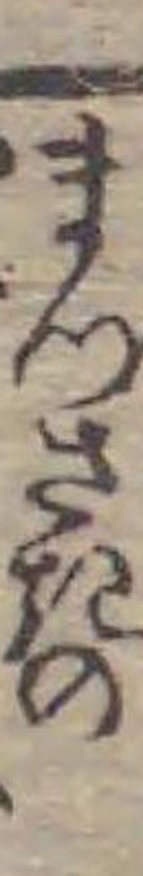まつさきの
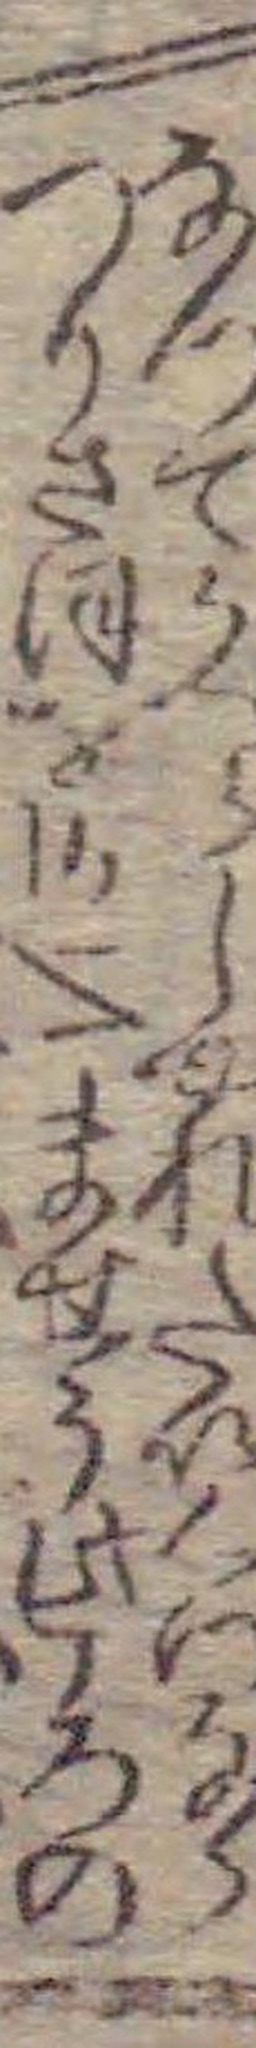つりさほをかしませう此ころの
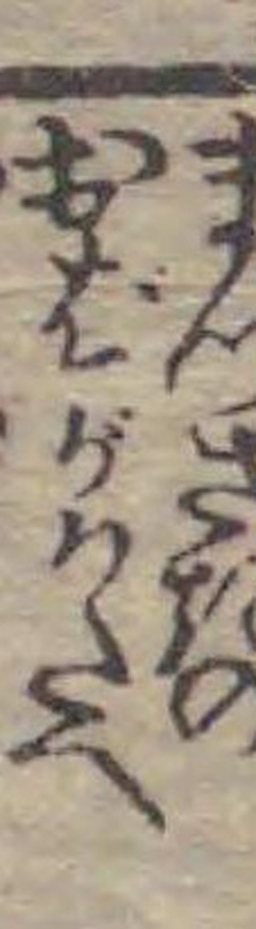おばがかたへ
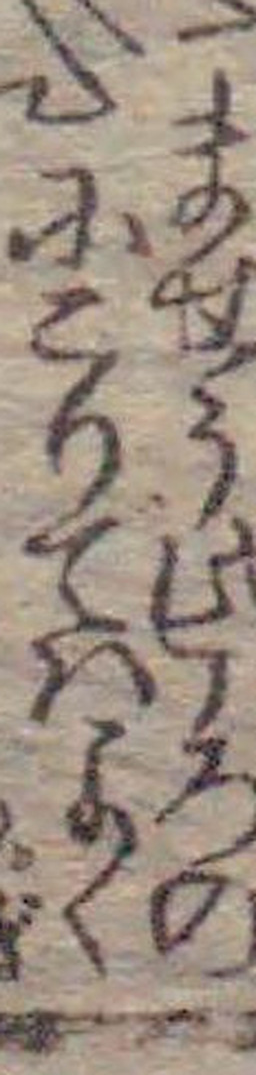にこりではよく
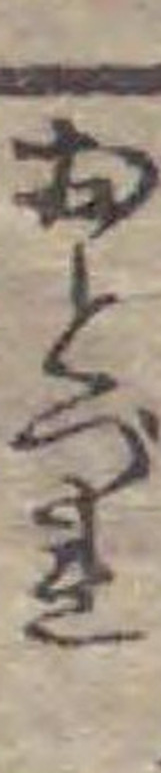おとづれ
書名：竜宮苦界玉手箱 : 3巻
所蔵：国立国会図書館 National Diet Library, JAPAN
